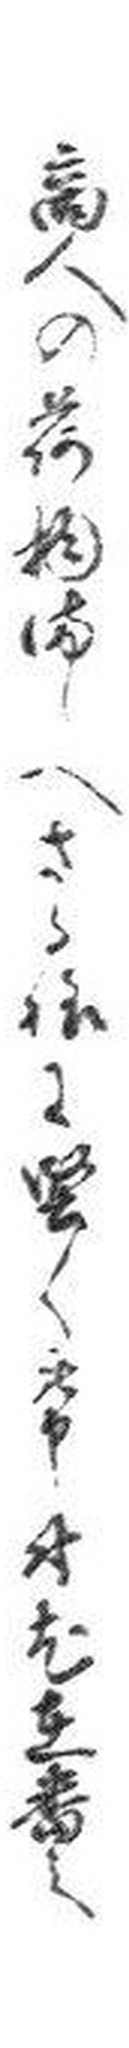商人の荷物備へさる様に堅く被申付尤在番之
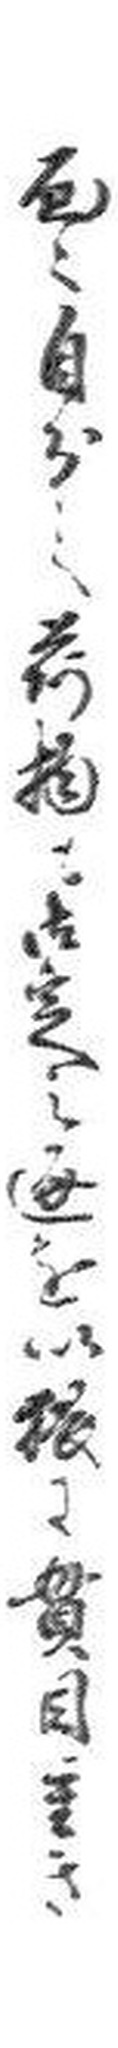面々自分之荷物も御定之通を以猥ニに貫目重き
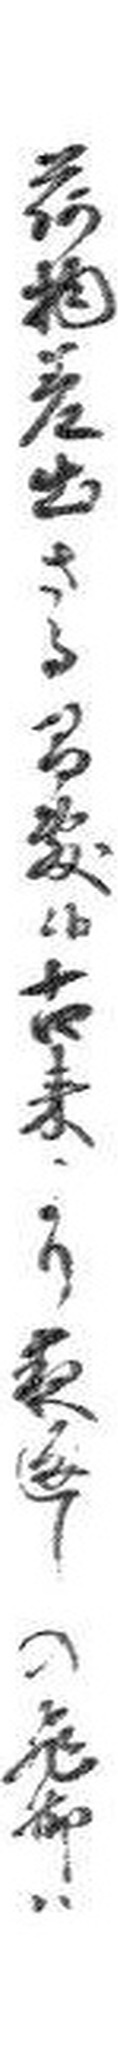荷物差出さる間敷候古来より夜通しの飛脚ㇵ
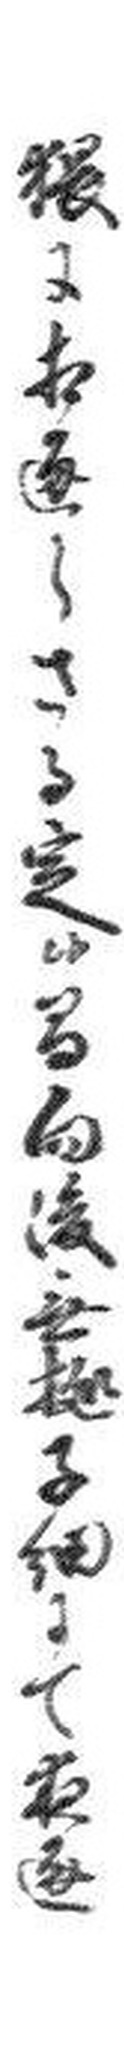猥に相通しさる定候間向後無拠子細にて夜通
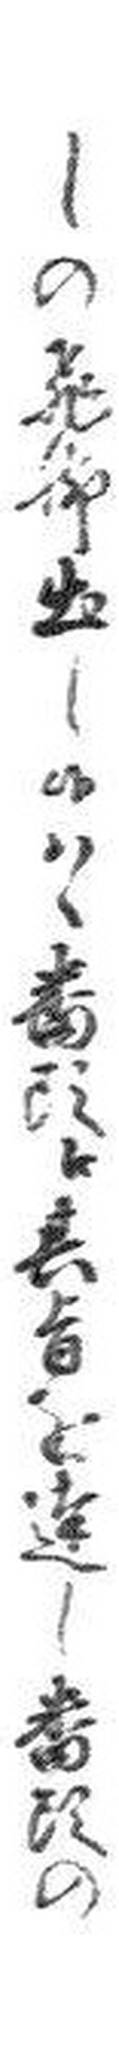しの飛脚出し候ハゝ番頭江其旨を達し番頭の
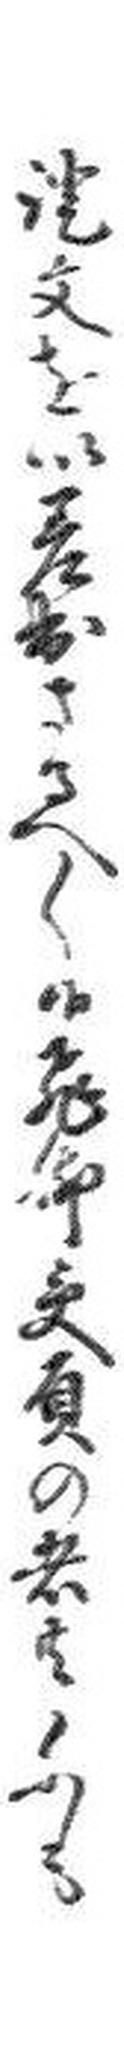証文を以差出さるへく候飛脚受負の者共にも
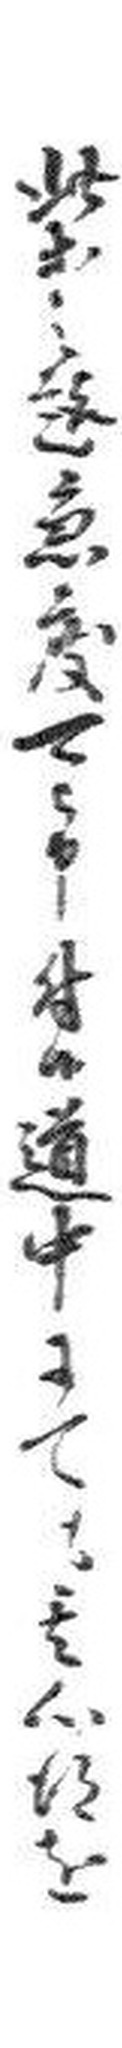此等之趣急度可被申付候道中にても其心得を
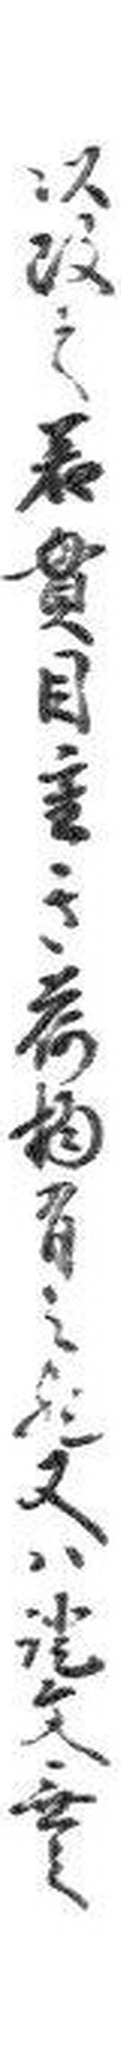以改之若貫目重き荷物有之歟又ㇵ証文無之
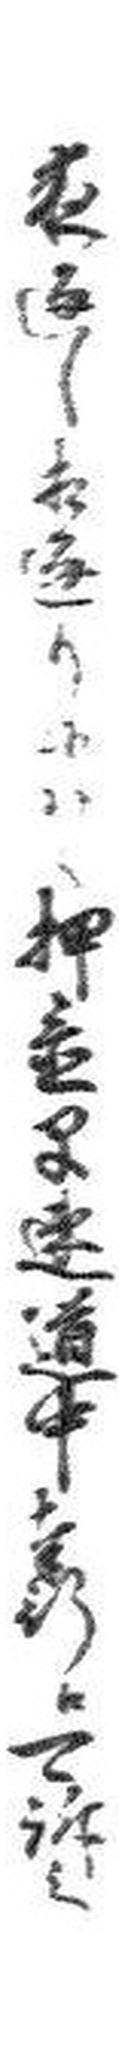夜通し相通り候ハゝ押置早速道中奉行江可訴之
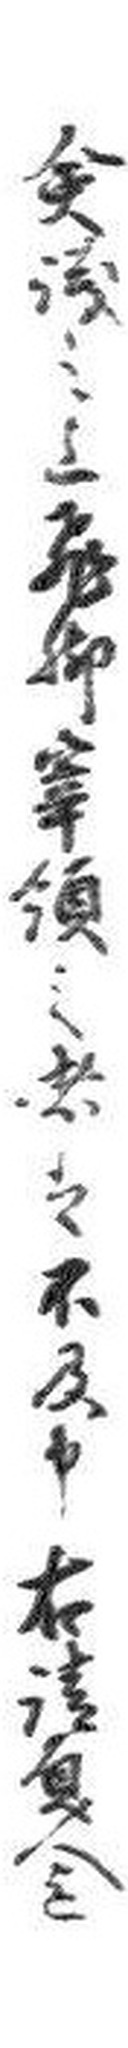僉議之上飛脚宰領之者は不及申右請負人迄
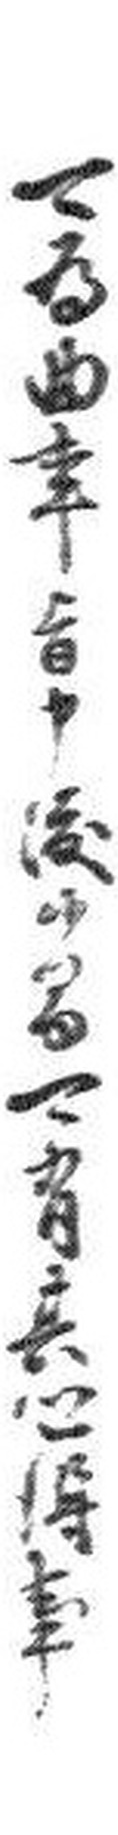可為曲事旨申渡候間可有其心得事
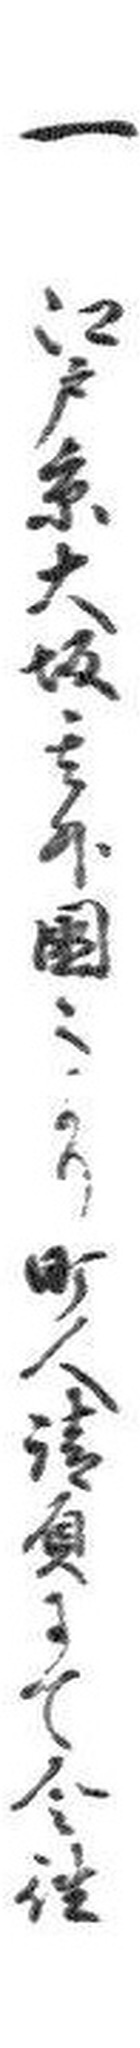一江戸京大坂其外国々より町人請負にて令往

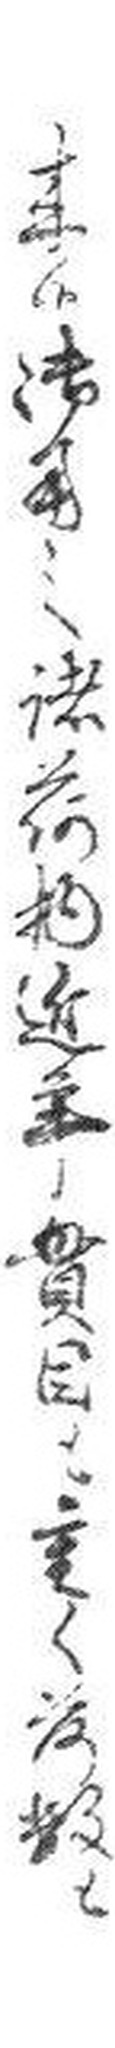来候御用之諸荷物近年貫目も重く荷数も
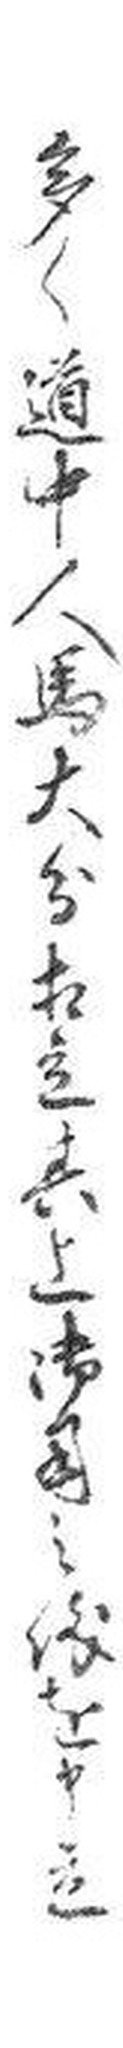多く道中人馬大分相立其上御用之儀を申立
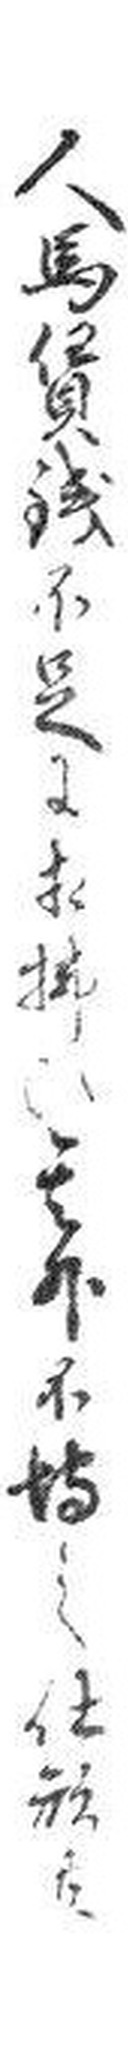人馬賃銭不足に相払ひ其外不埒之仕形共
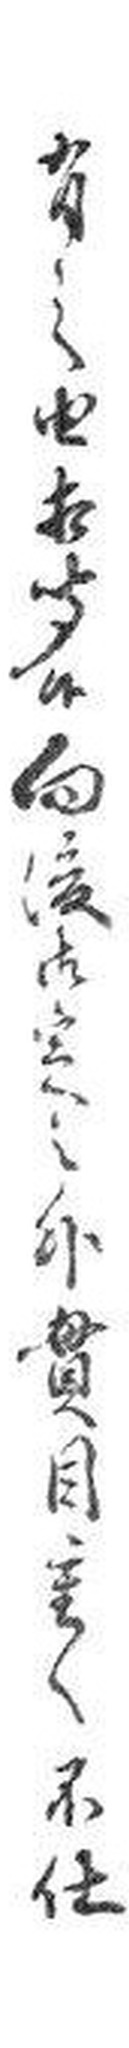有之由相聞候向後御定之外貫目重く不仕
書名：家譜 二十九 吉邦公 従正徳二年到正徳三年
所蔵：福井県文書館 Fukui Prefectural Archives
